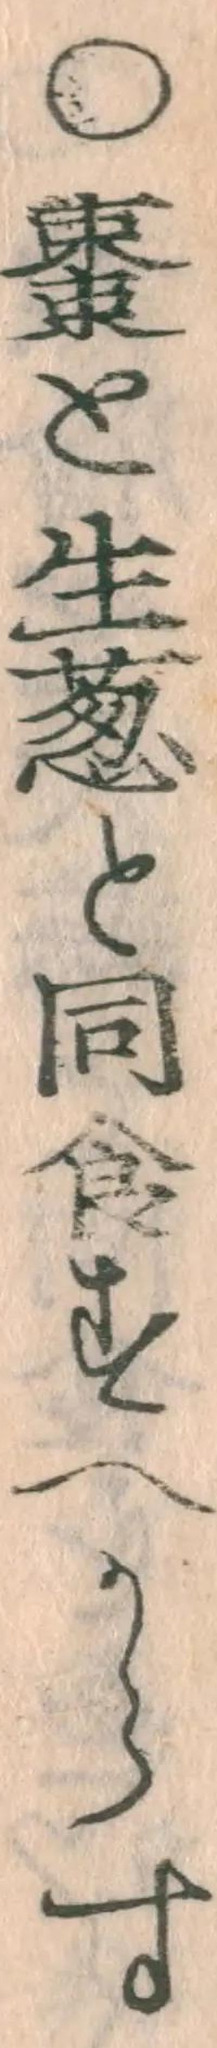〇棗と生葱と同食すへからす
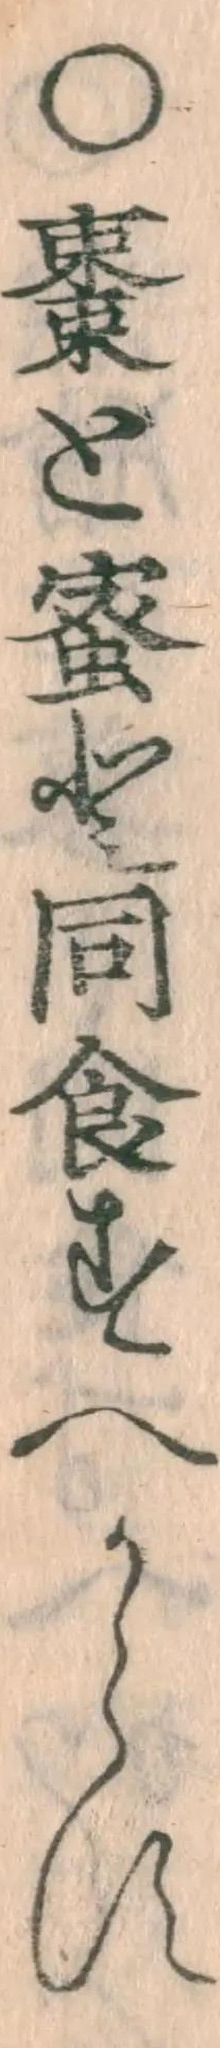〇棗と蜜と同食すへからす
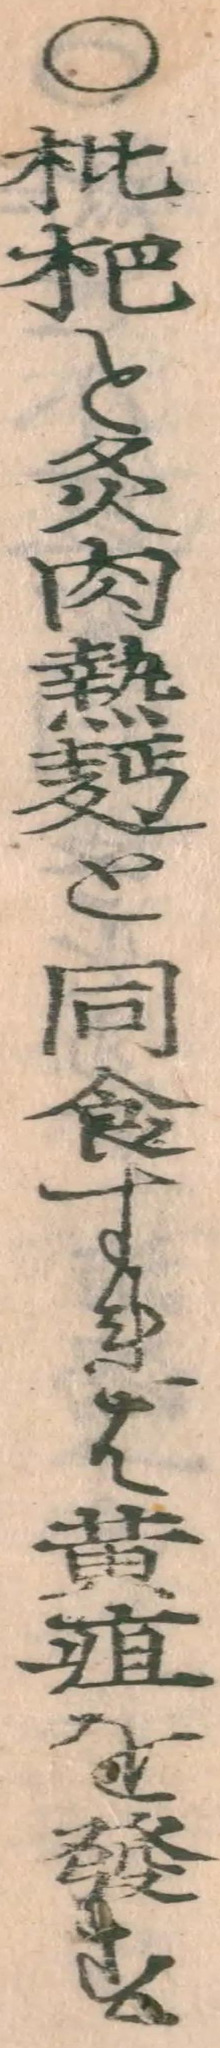〇枇杷と炙肉熱麺と同食すれは黄疽を発す
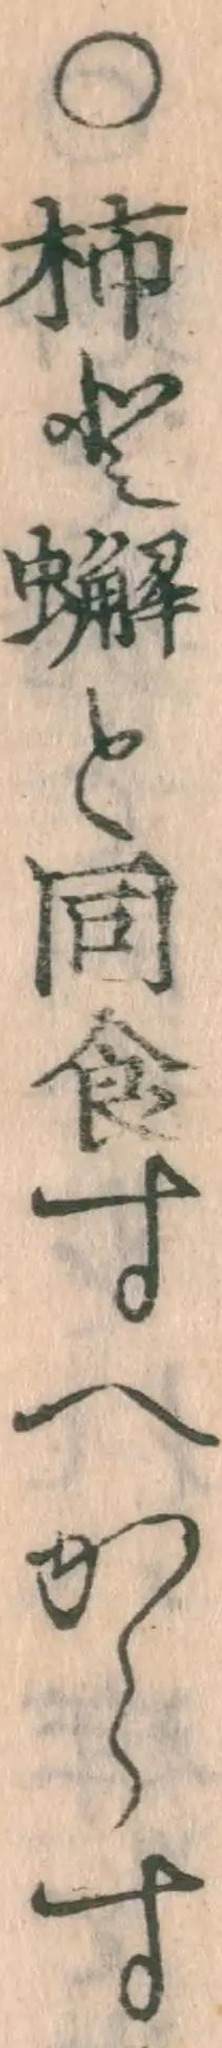〇柿と蟹と同食すへからす
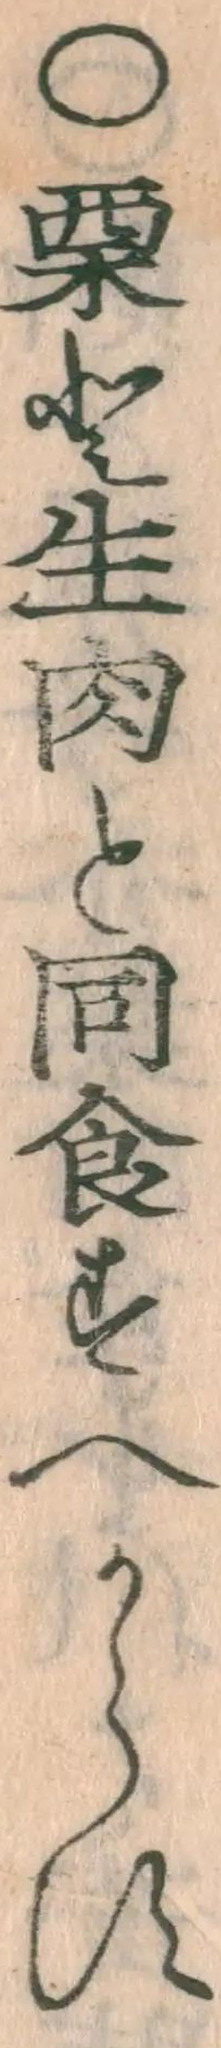〇栗と生肉と同食すへからす
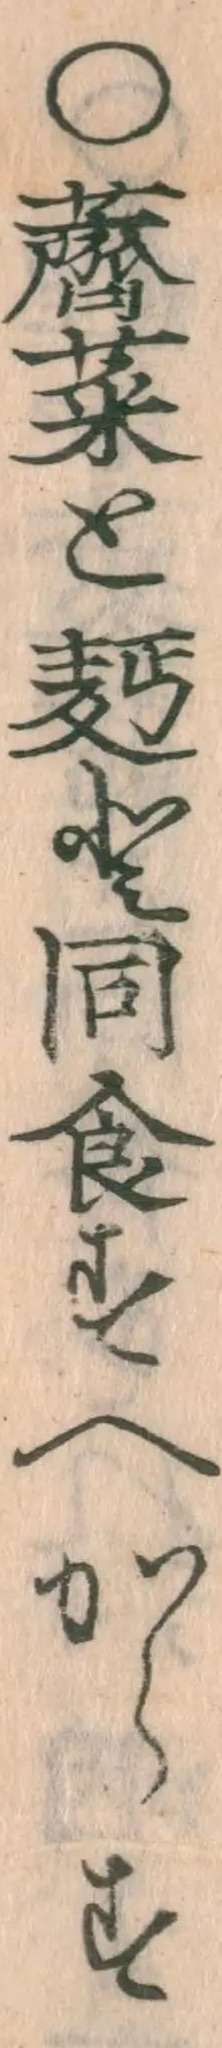〇薺菜と麺と同食すへからす
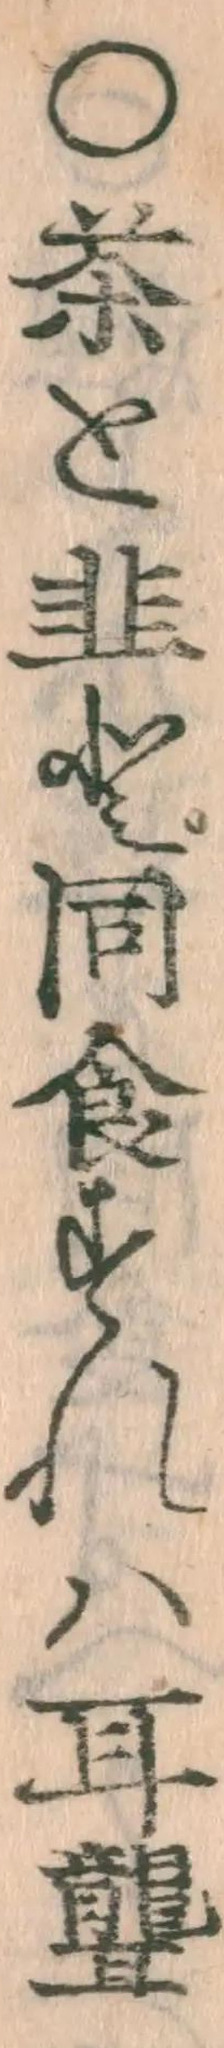〇茶と韮と同食すれは耳聾
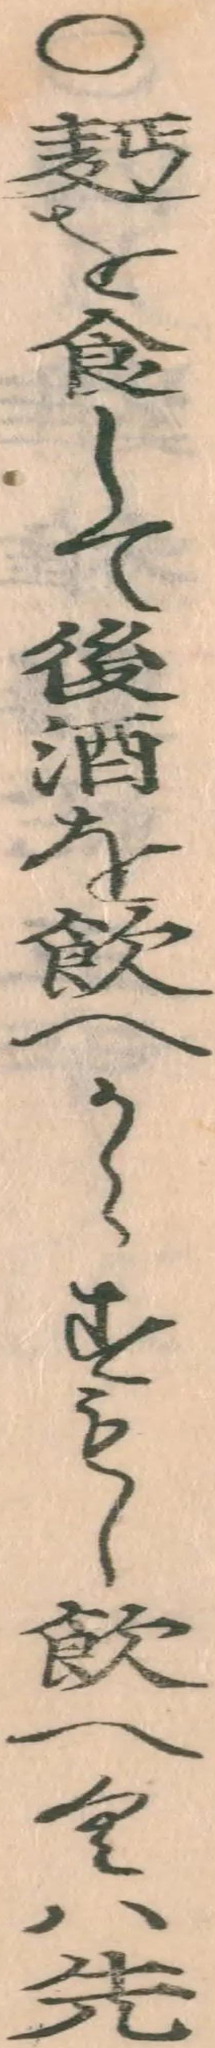〇麺を食して後酒を飲へからすもし飲へくは先
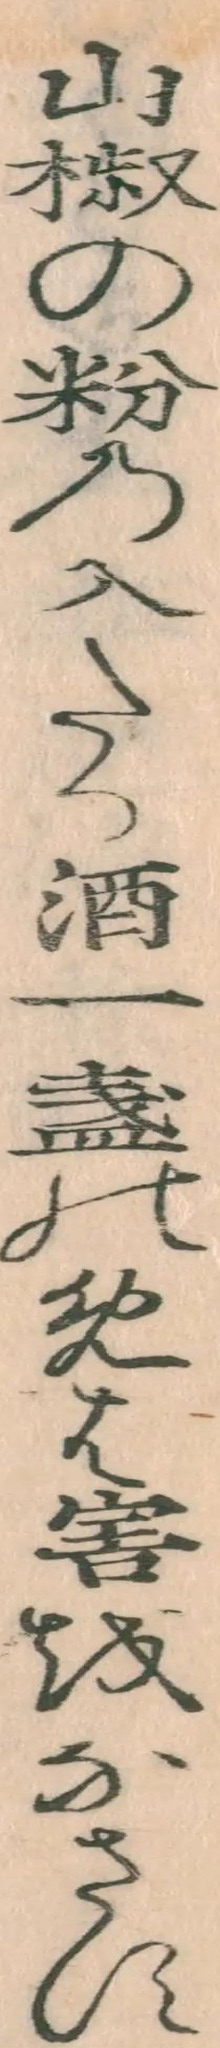山椒の粉の入たる酒一盞のめは害をなさす
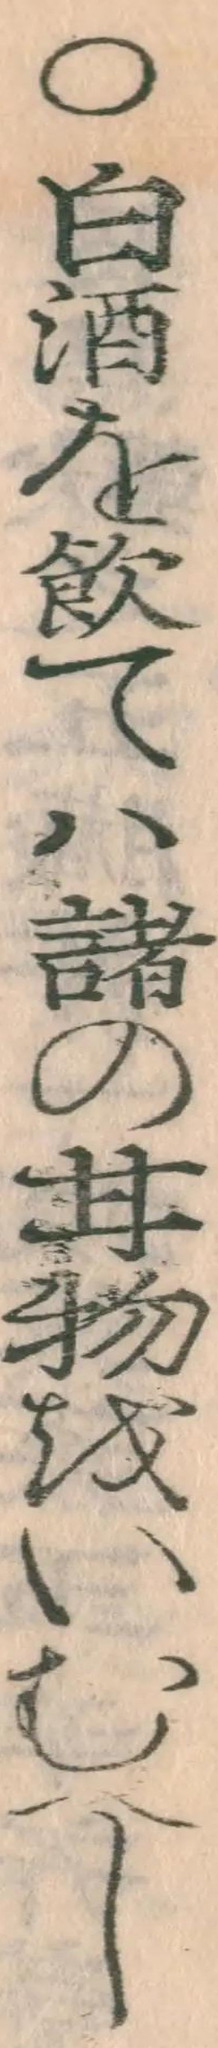〇白酒を飲ては諸の甘物をいむへし
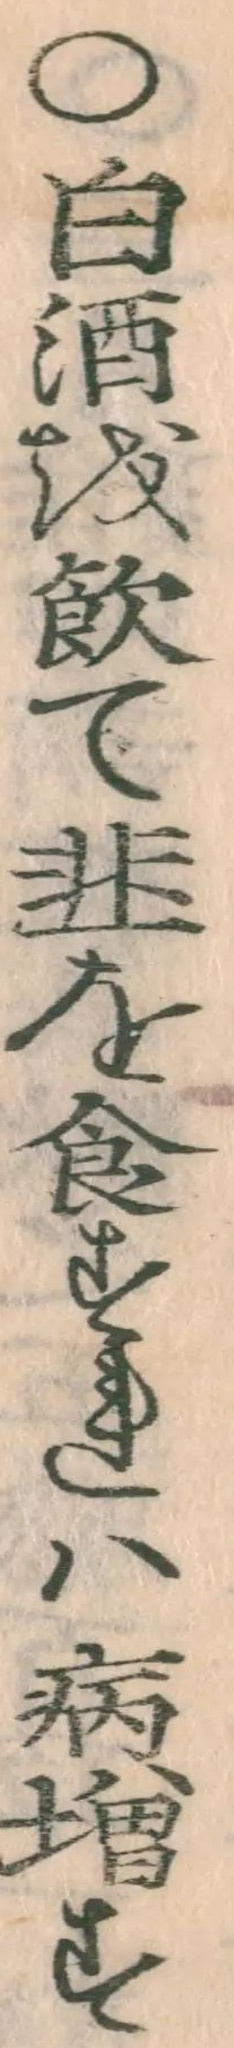〇白酒を飲て韮を食すれは病増す
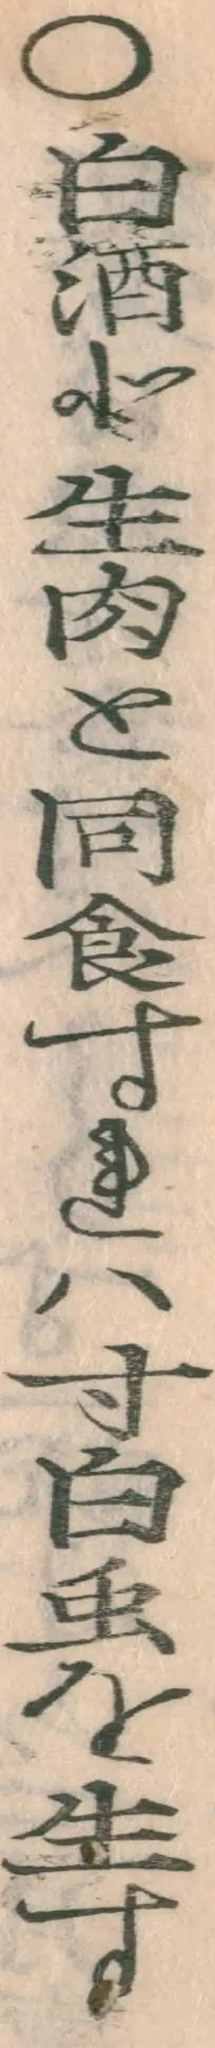〇白酒と生肉と同食すれは寸白虫を生す
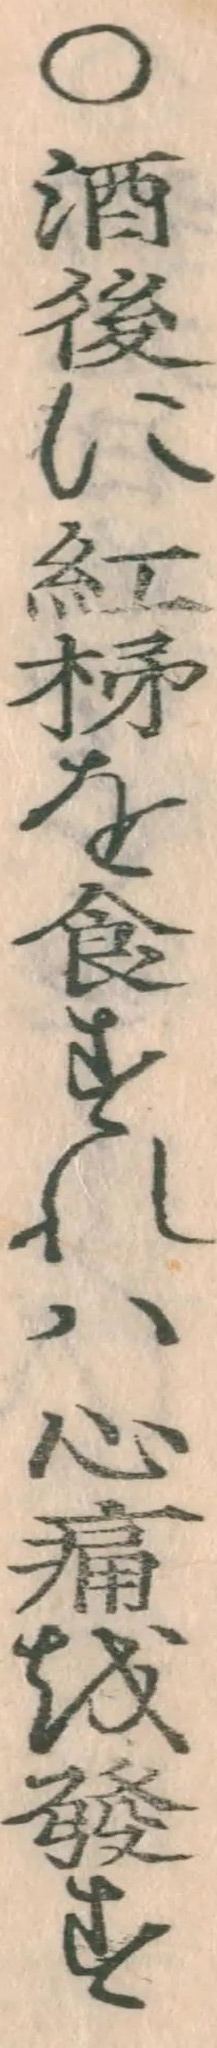〇酒後に紅柿を食すれは心痛を発す
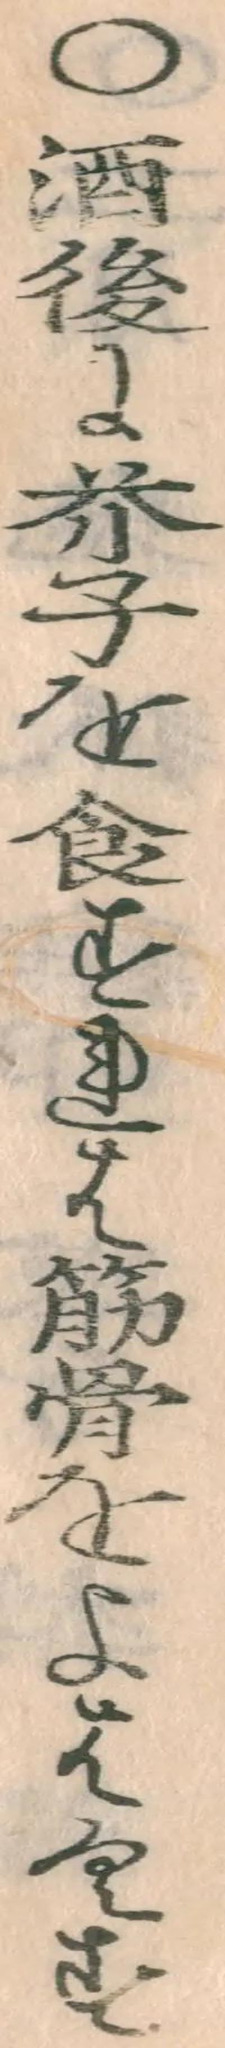〇酒後に芥子を食すれは筋骨をよはくす
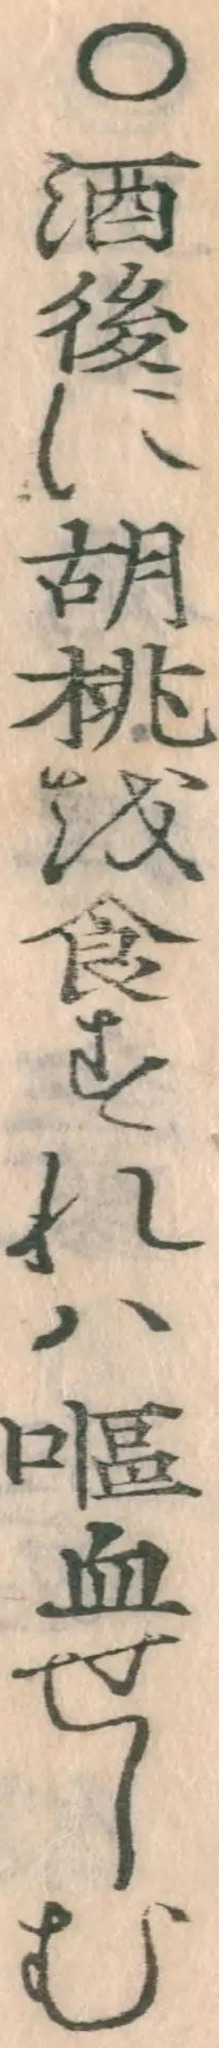〇酒後に胡桃を食すれは嘔血せしむ
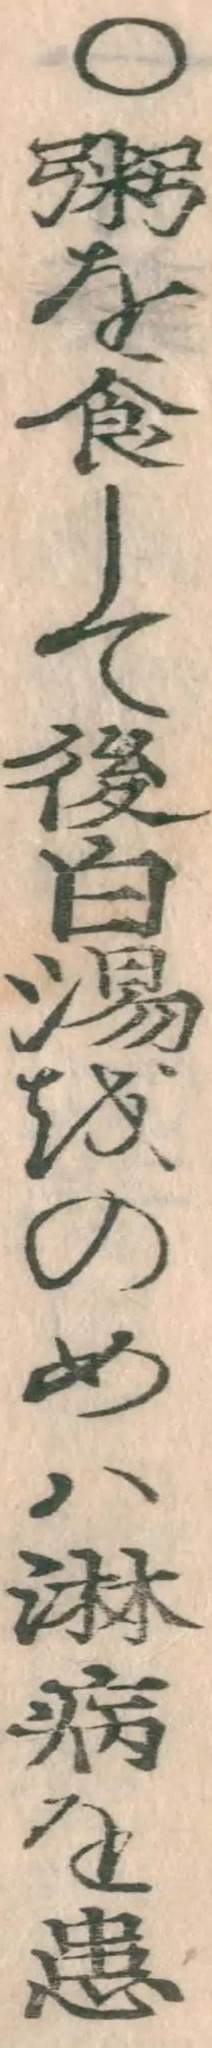〇粥を食して後白湯をのめは淋病を患
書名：延壽撮要
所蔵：国立国会図書館 National Diet Library, JAPAN
